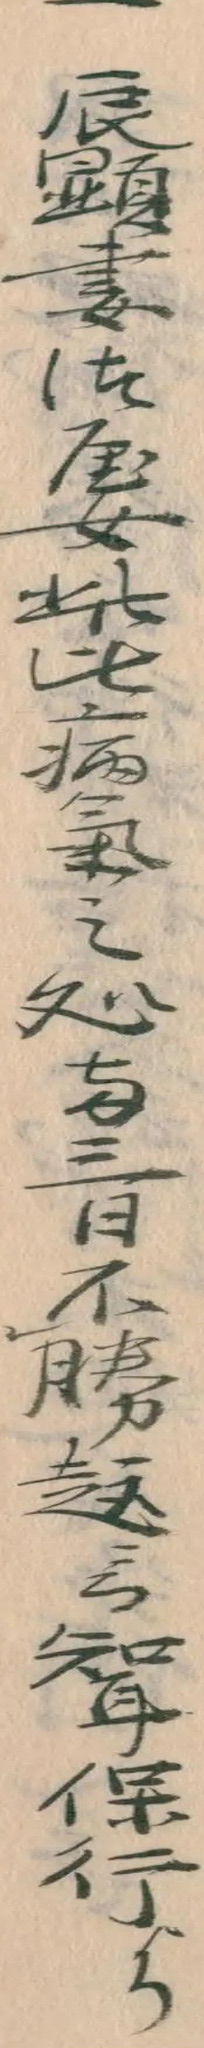一辰顕妻佐屋女此比病氣之処両三日不勝趣ニ而聟保行より
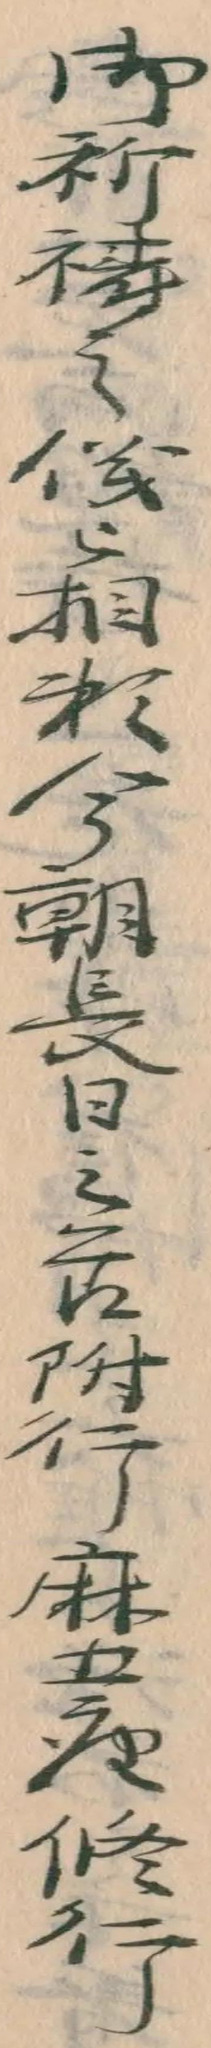御祈祷之儀被相頼今朝長日之節附行麻五座修行
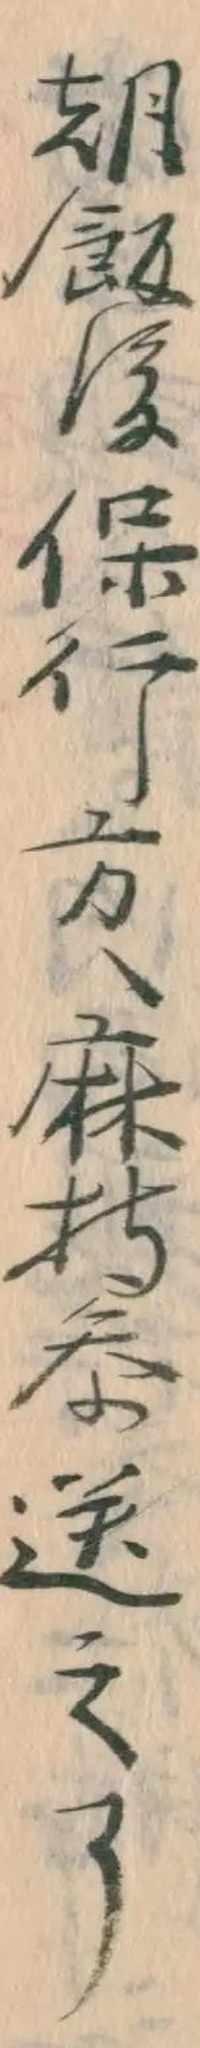朝飯後保行方へ麻持参送之了
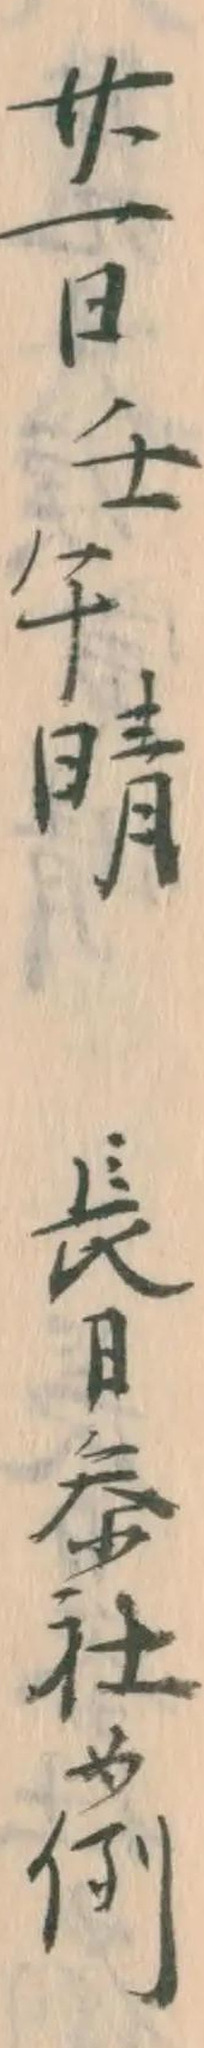廿一日壬午晴長日参社如例
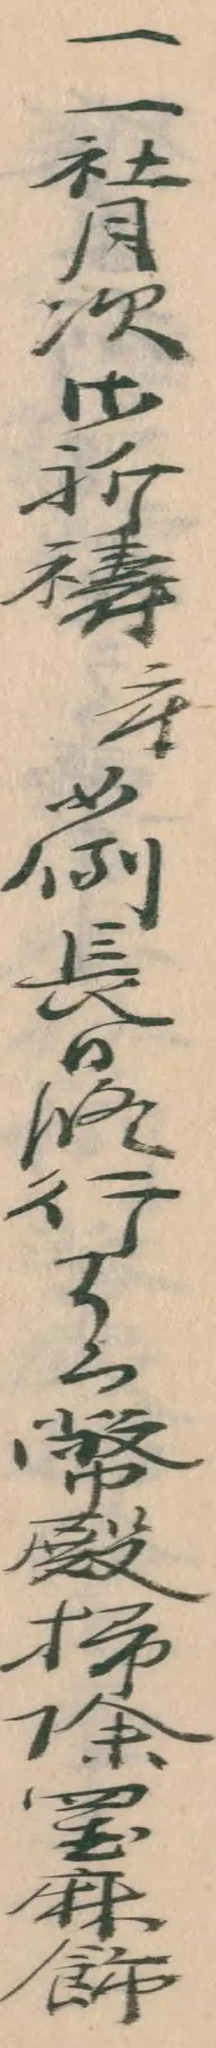一一社月次御祈祷ニ付如例長日修行了而幣殿掃除置麻飾
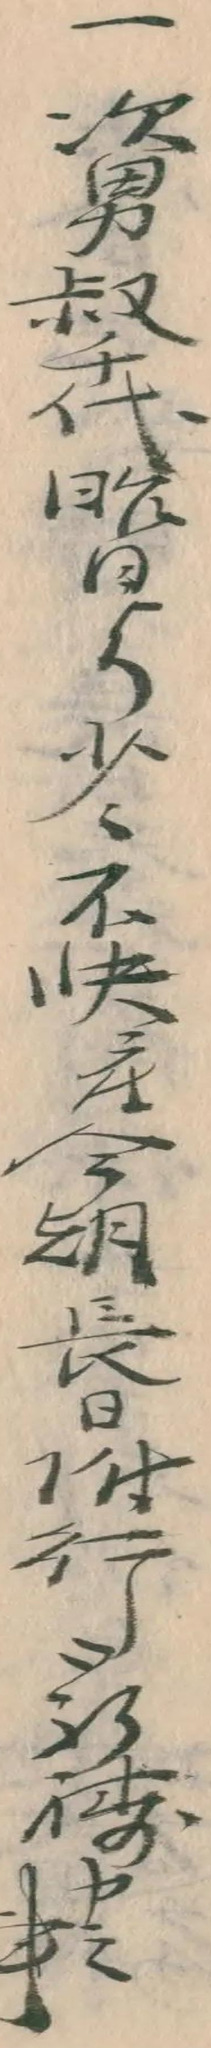一次男叔千代昨日より少々不快ニ付今朝長日附行御祈祷申之事
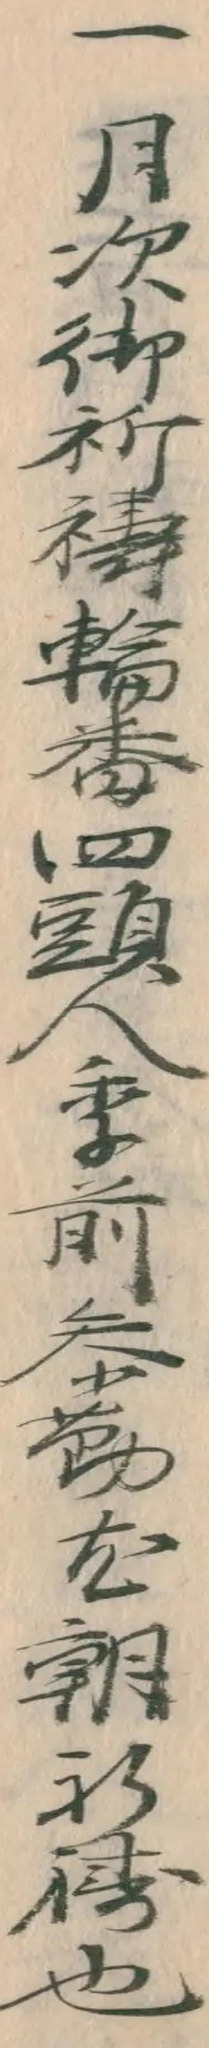一月次御祈祷輪番四頭人季前参勤尤朝祈祷也
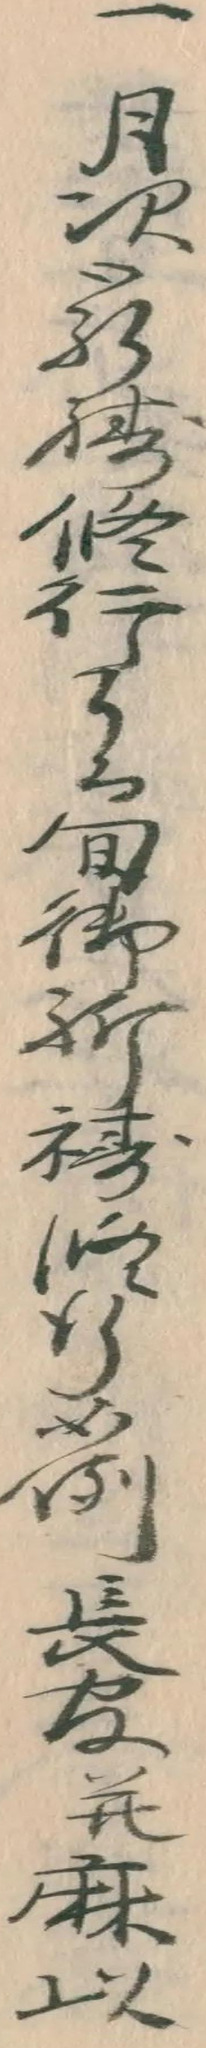一月次御祈祷修行了而旬御祈禱修行如例長官并麻以
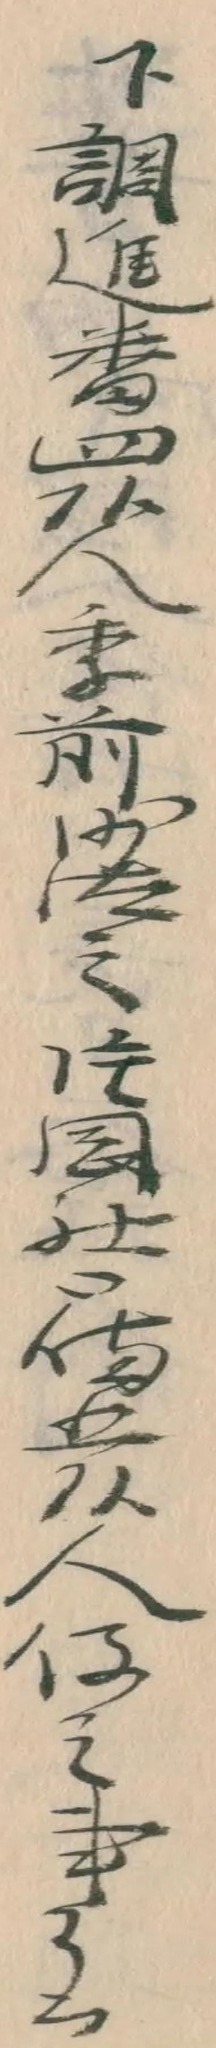下調進番四頭人季前沙汰之片岡社御備五頭人役之事了而
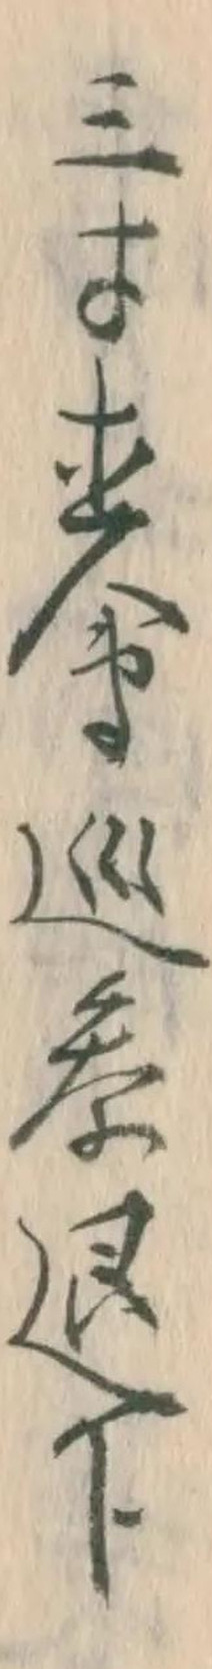三寸直會巡参退下
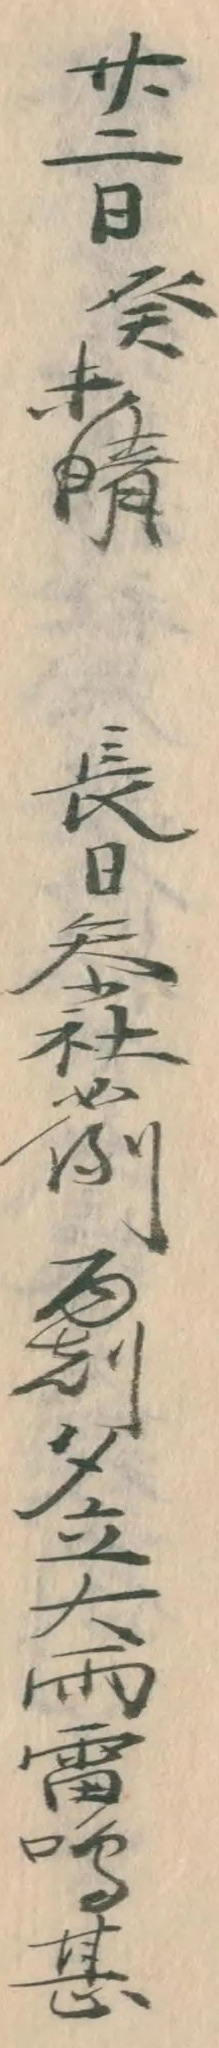廿二日癸未晴長日参社如例酉刻夕立大雨雷鳴甚
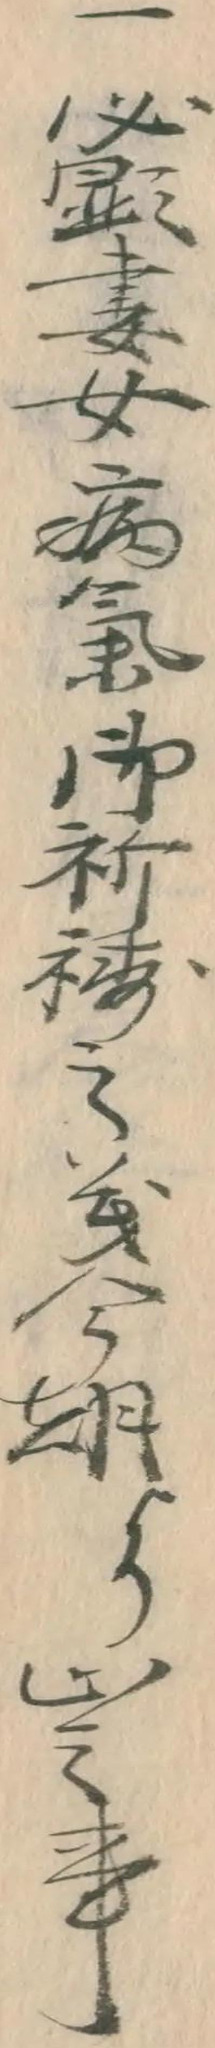一必顕妻女病氣御祈祷之義今朝より出之事

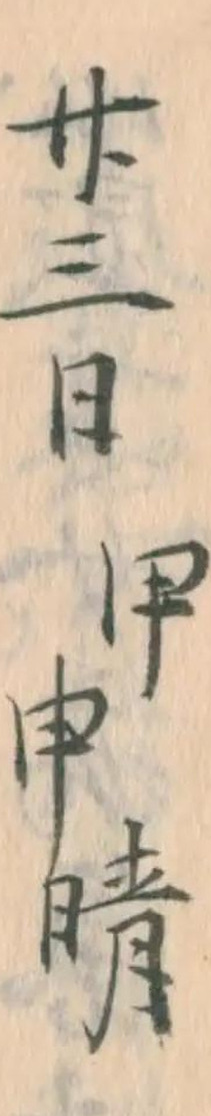廿三日甲申晴
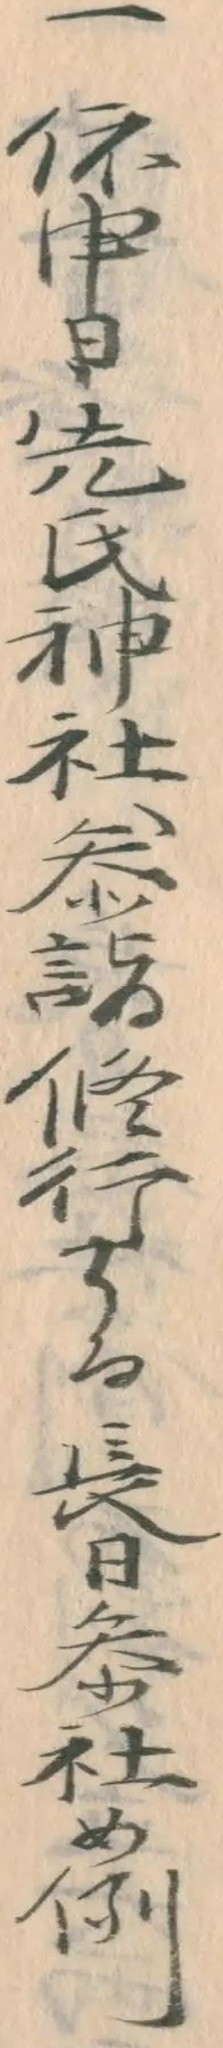一依申日先氏神社へ参詣修行了而長日参社如例
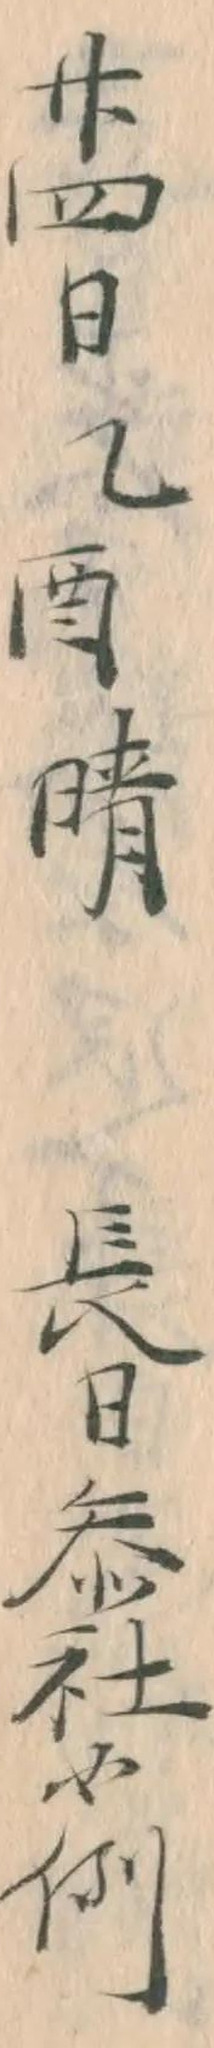廿四日乙酉晴長日参社如例
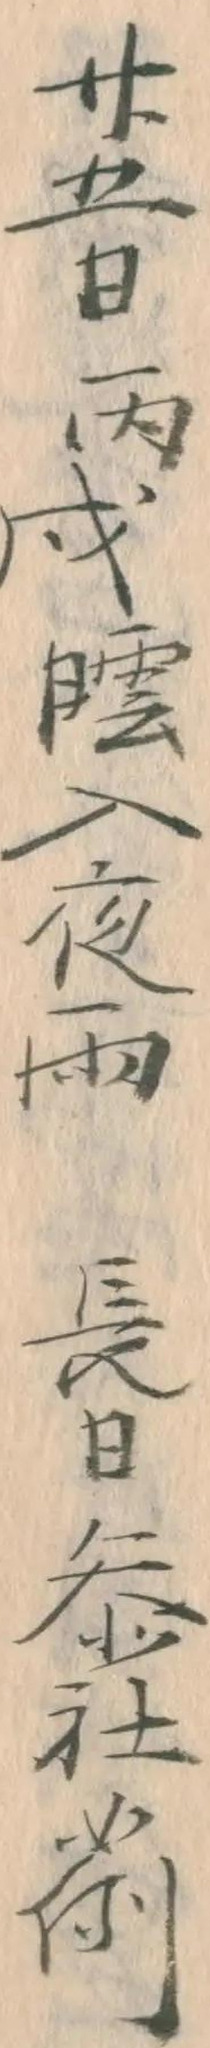廿五日丙戌曇入夜雨長日参社如例
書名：賀茂社記録. 第73冊
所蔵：国立国会図書館 National Diet Library, JAPAN
